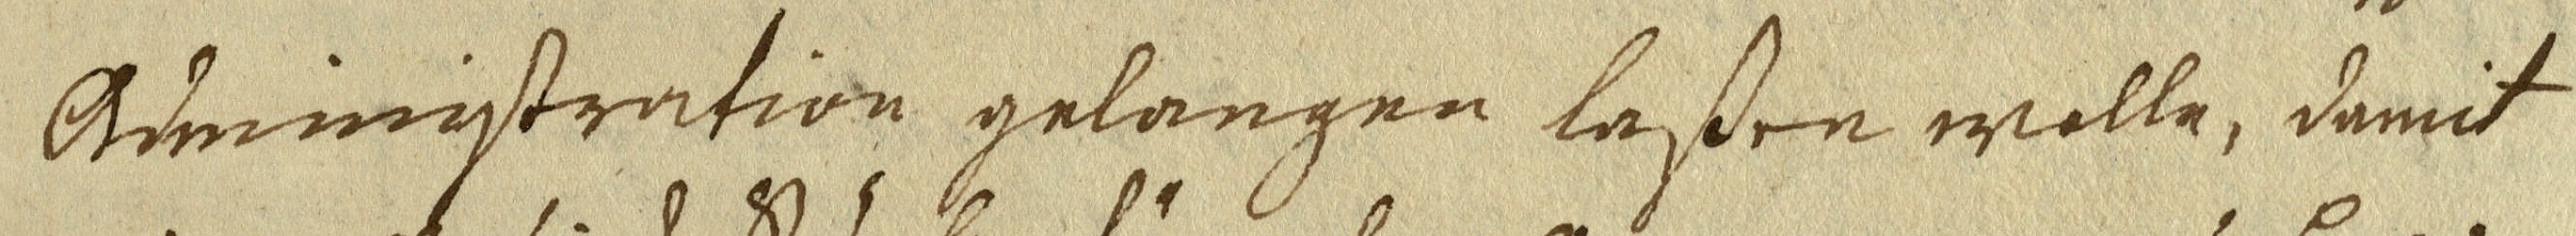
Administration gelangen laßen wolle, damit
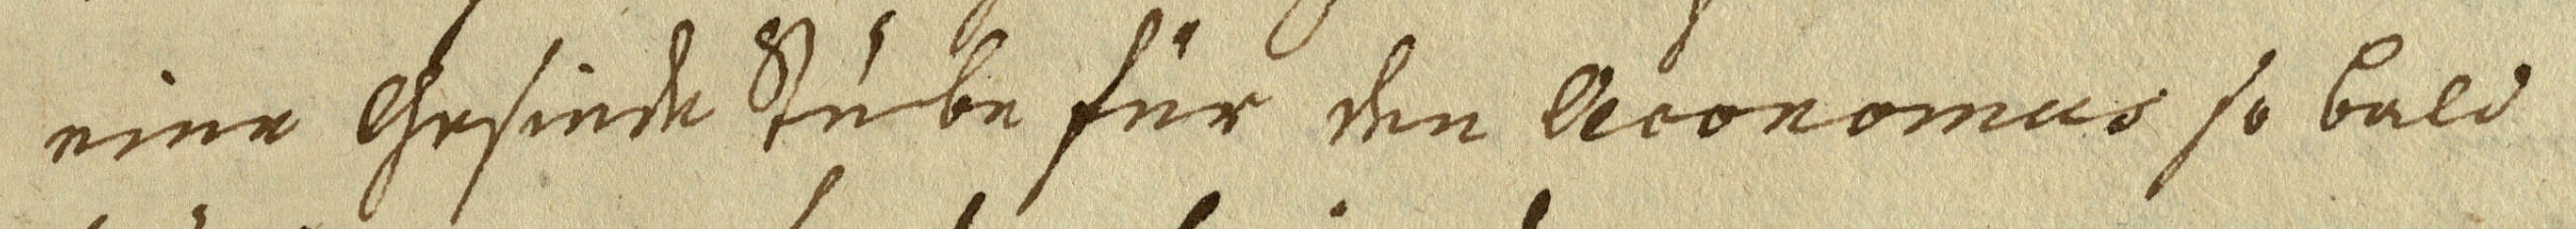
eine Gesinde Stube für den Oeconomus so bald
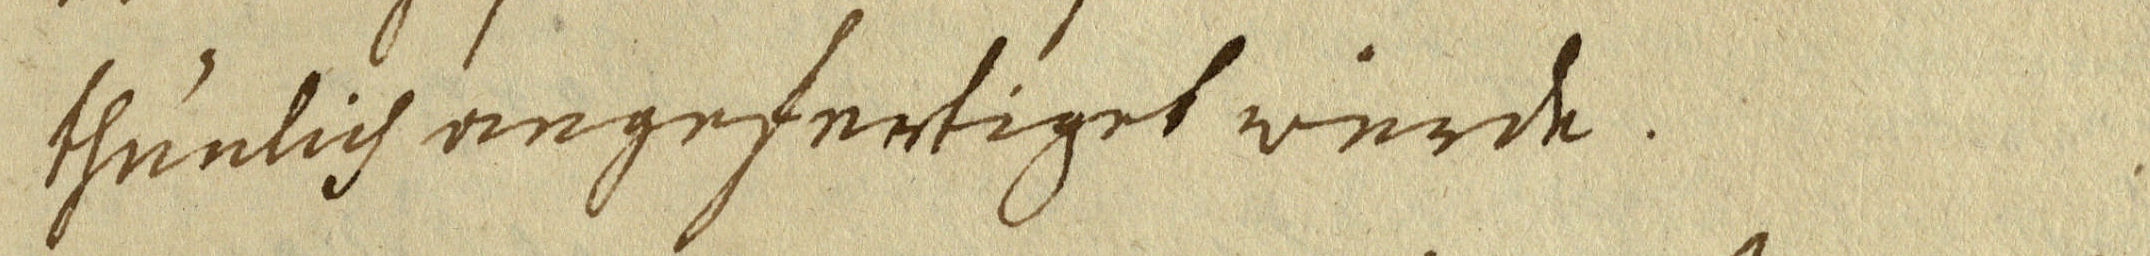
thunlich angefertiget würde.
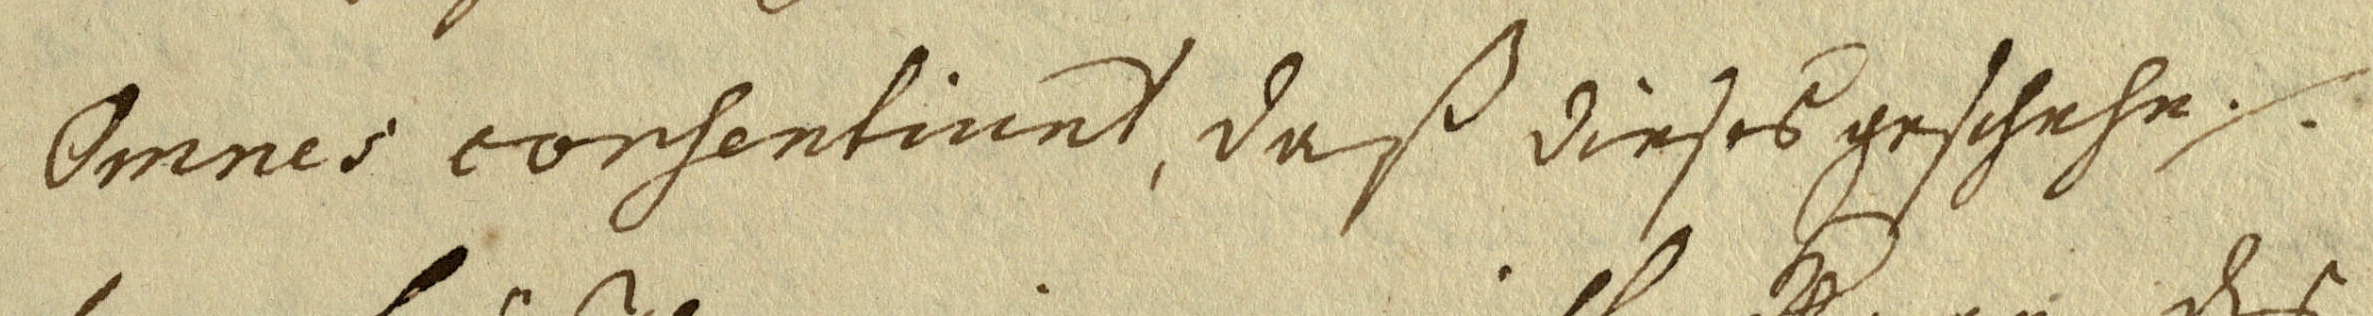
Omnes consentiunt, daß dieses geschehe.
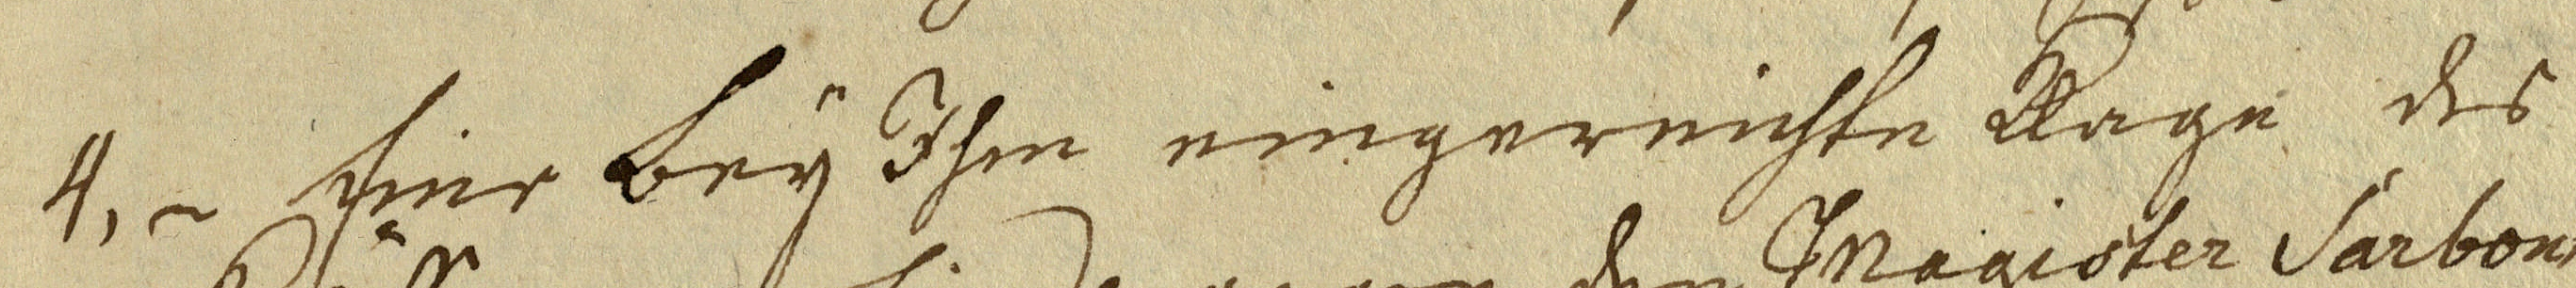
4. Eine Beÿ Ihm eingereichte Klage des
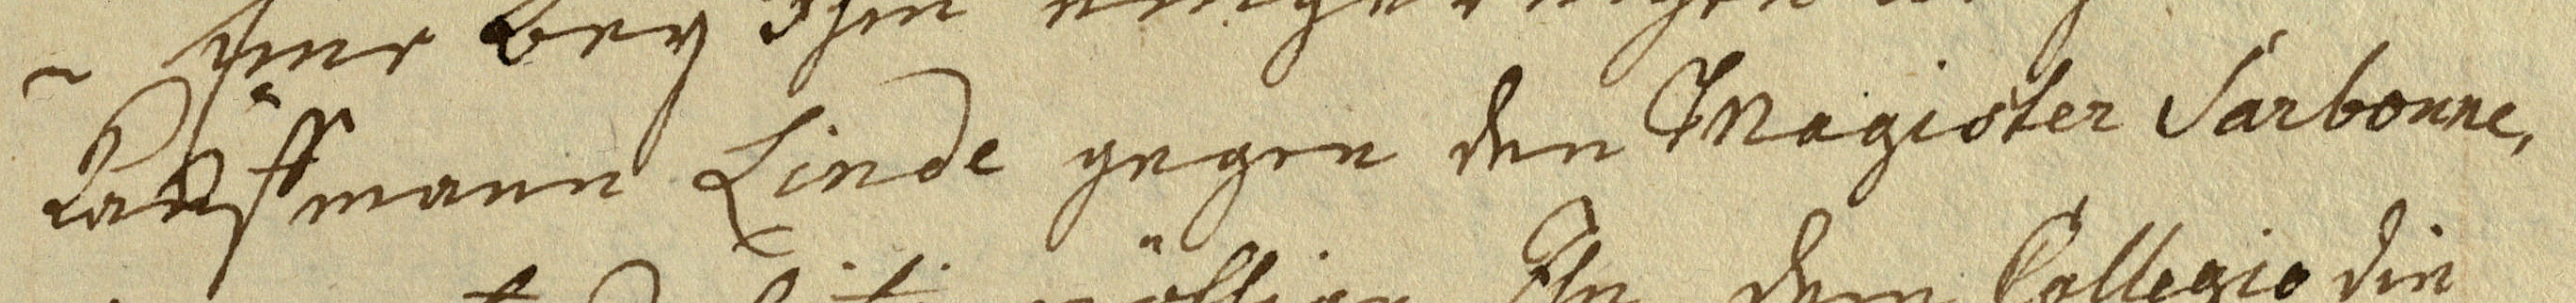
Kaufmann Linde gegen den Magister Sarbonne,
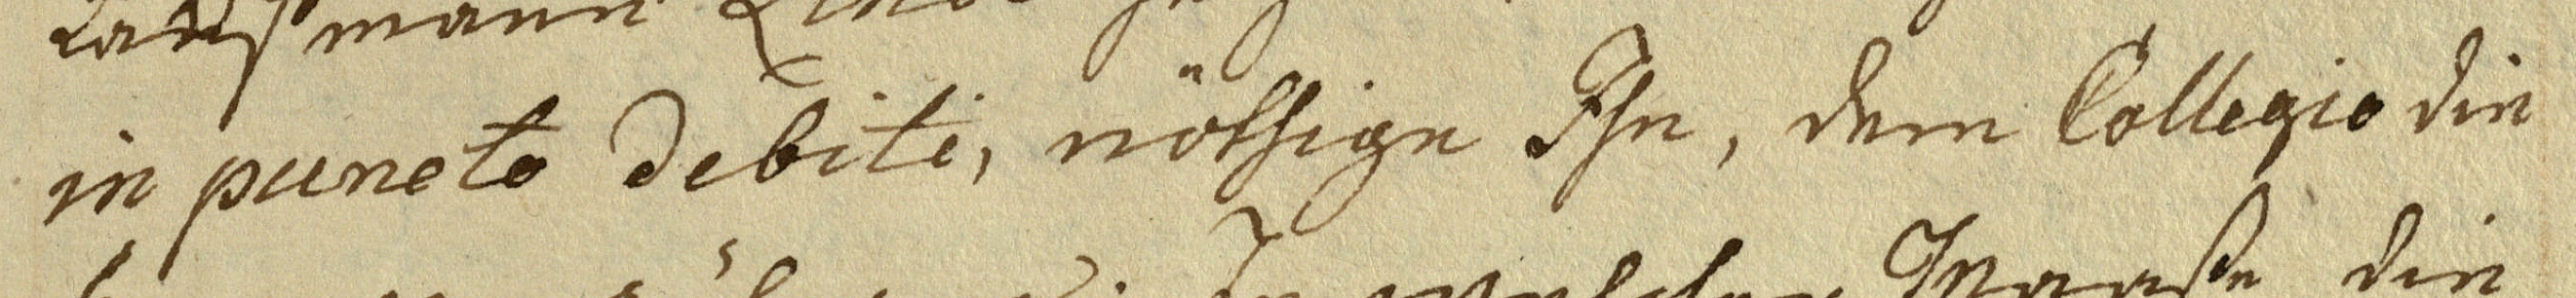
in puncto debiti, nöthige Ihn, dem Collegio die
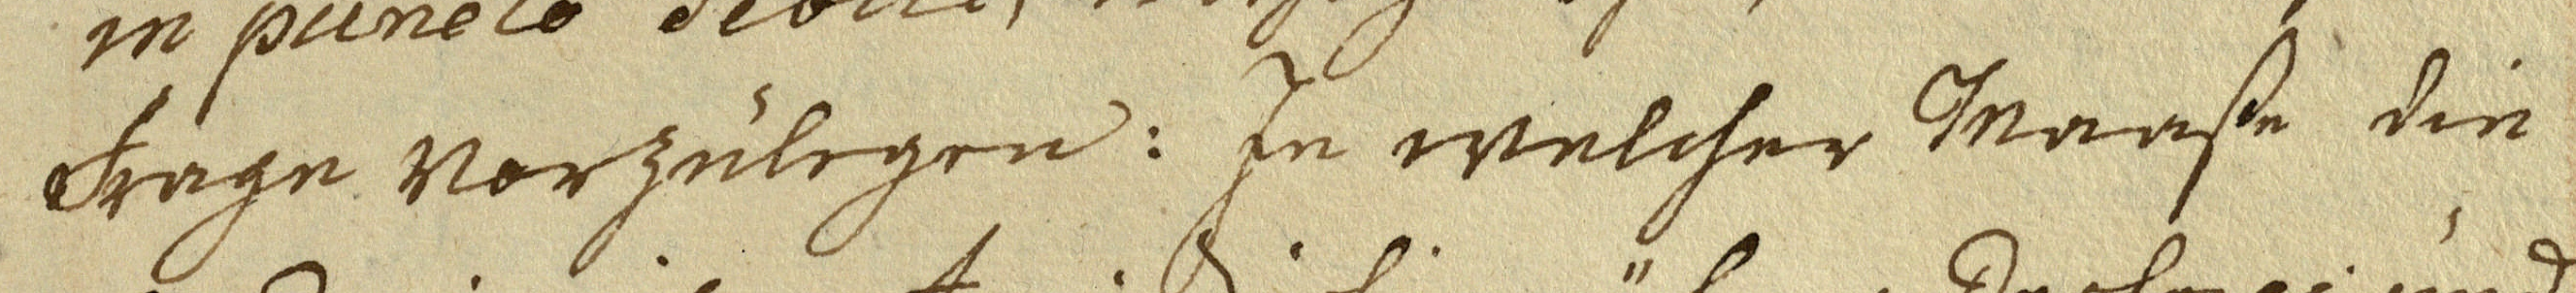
Frage vorzulegen: In welcher Maaße die
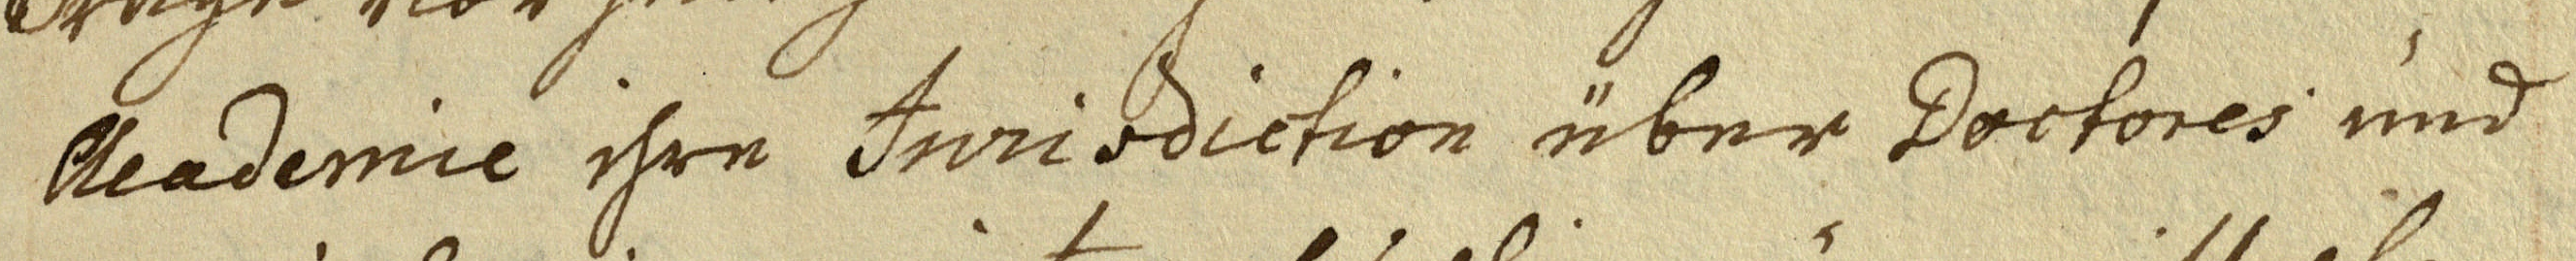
Academie ihre Jurisdiction über Doctores und
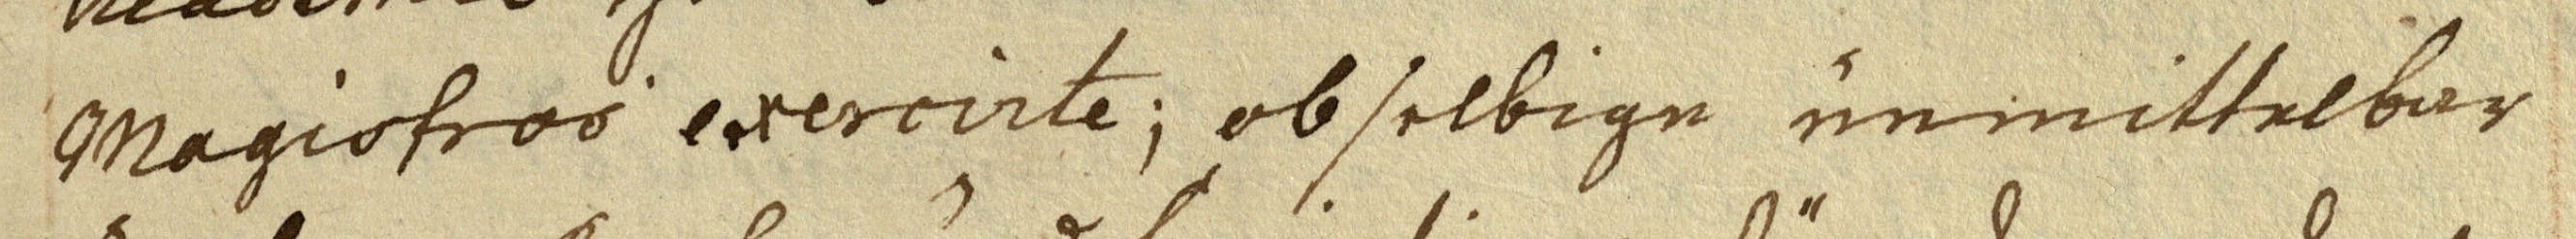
Magistros exercirte, ob selbige unmittelbar
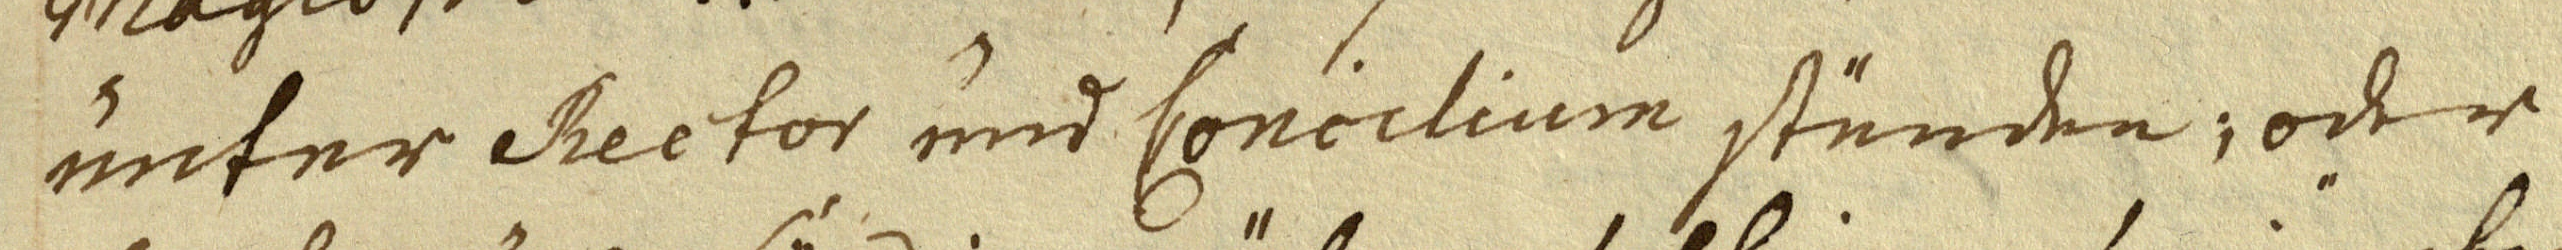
unter Rector und Concilium stünden, oder
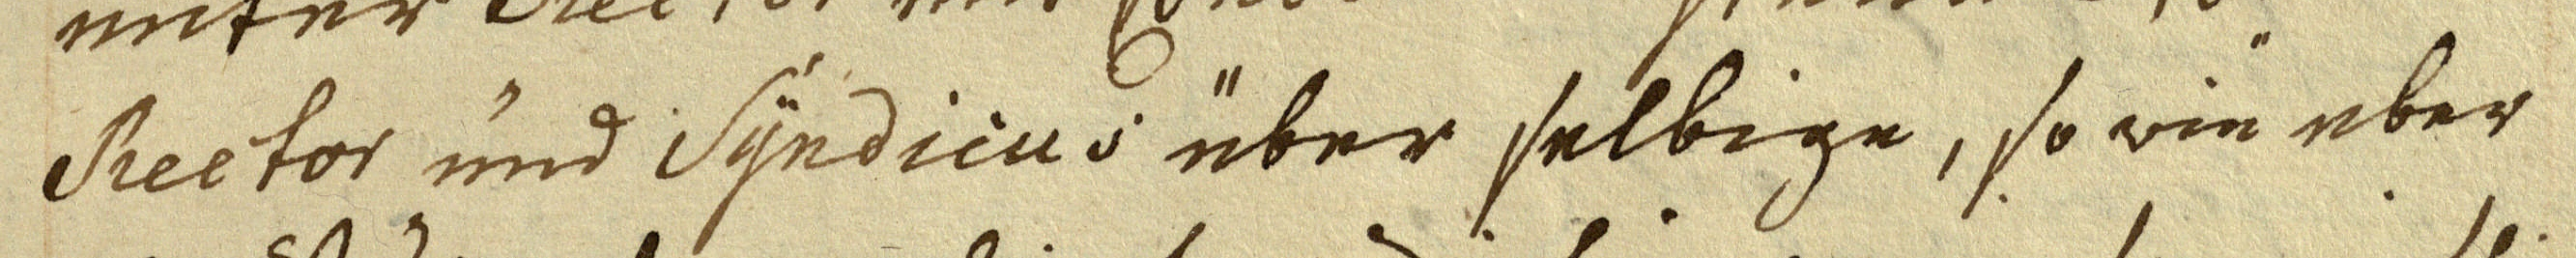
Rector und Sÿndicus über selbige, so wie über
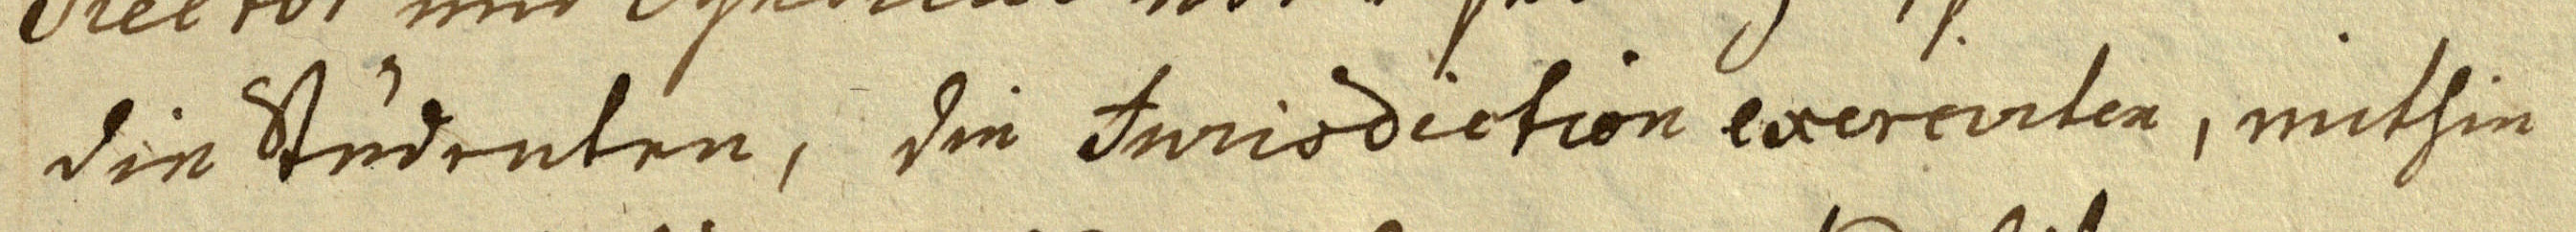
die Studenten, die Jurisdiction exercirten, mithin
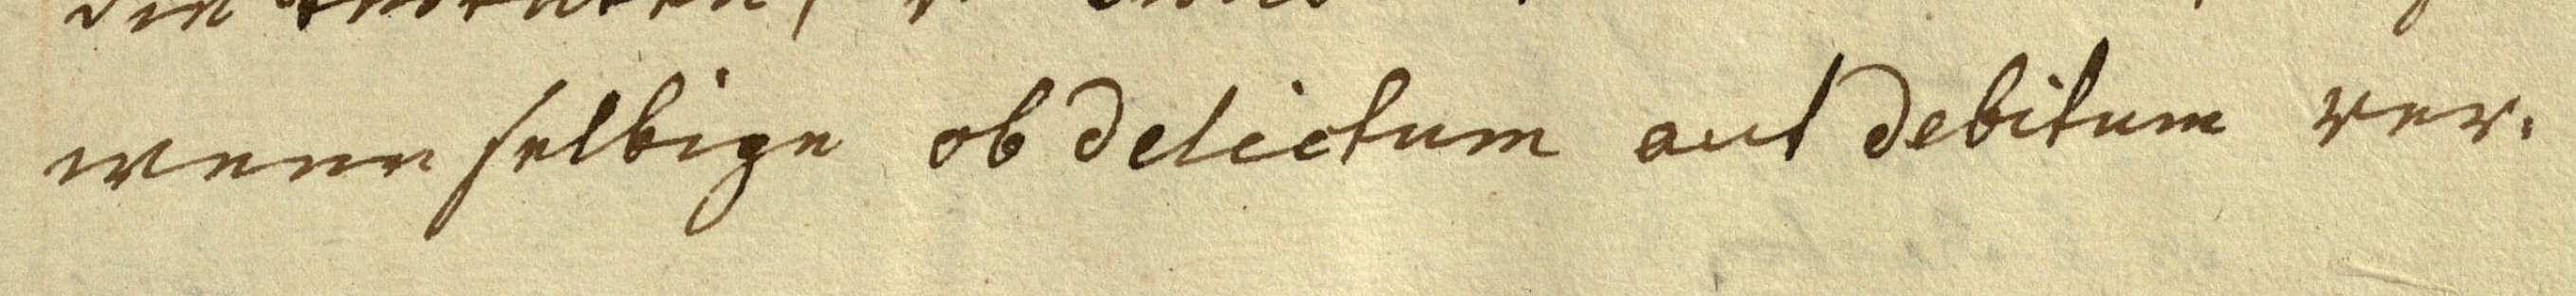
wenn selbige ob delictum aut debitum ver¬
